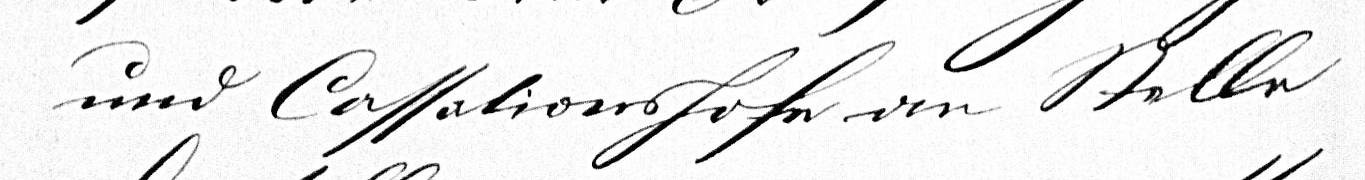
und Cassationshofe an Stelle
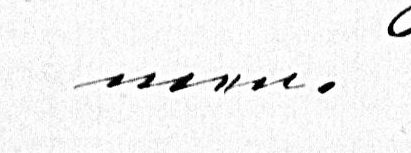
men.
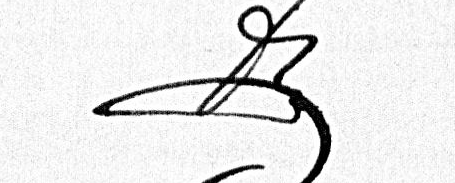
xx
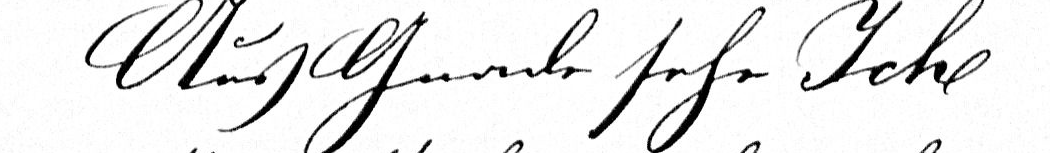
Aus Gnade sehr Ich
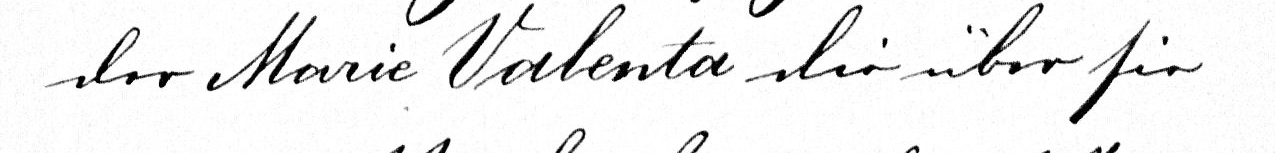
der Marie Valenta dir über sie
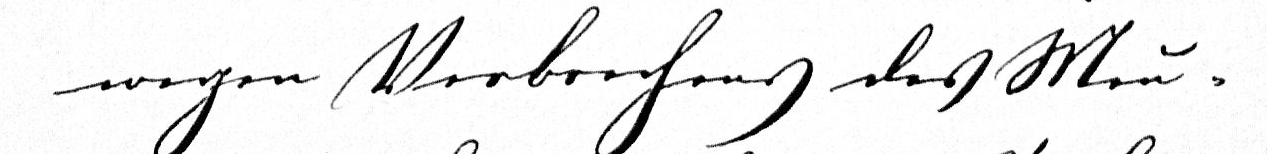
wegen Verbrechens des Meu¬
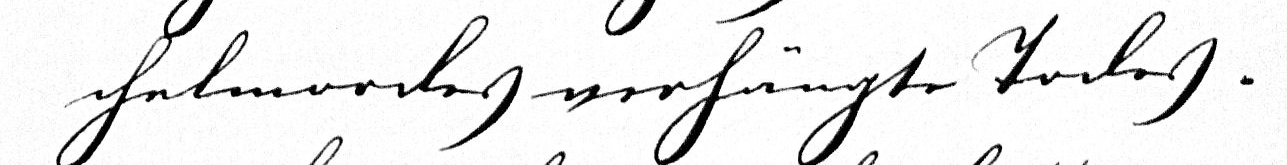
chelmordes verhängte Todes¬
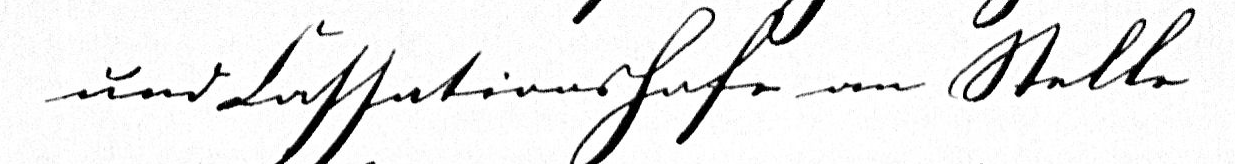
und Cassationshofe an Stelle
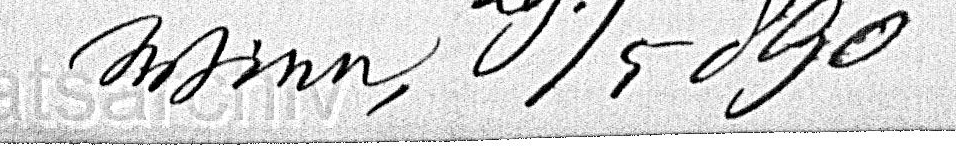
Wien, 29. /5 890
